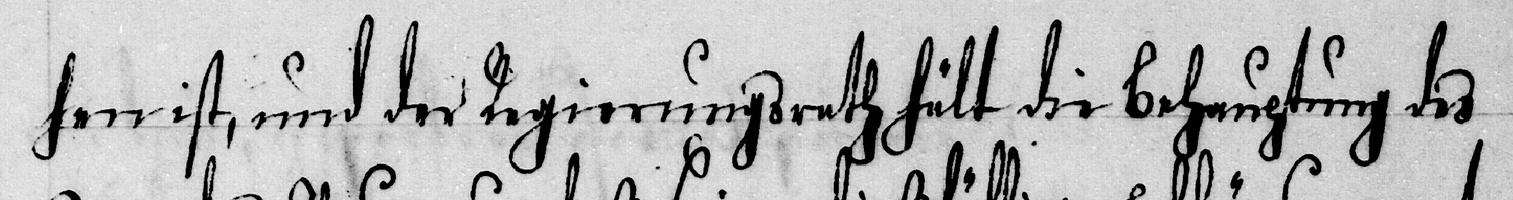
hen ist, und der Regierungsrath hält die Behauptung des
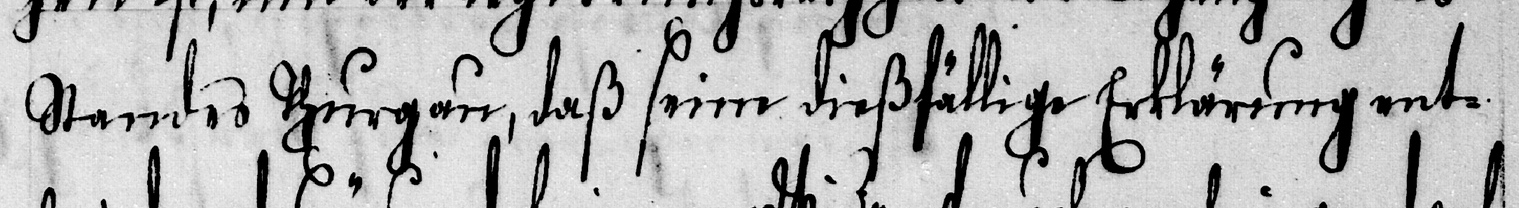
Standes Thurgau, daß seine dießfällige Erklärung ent¬
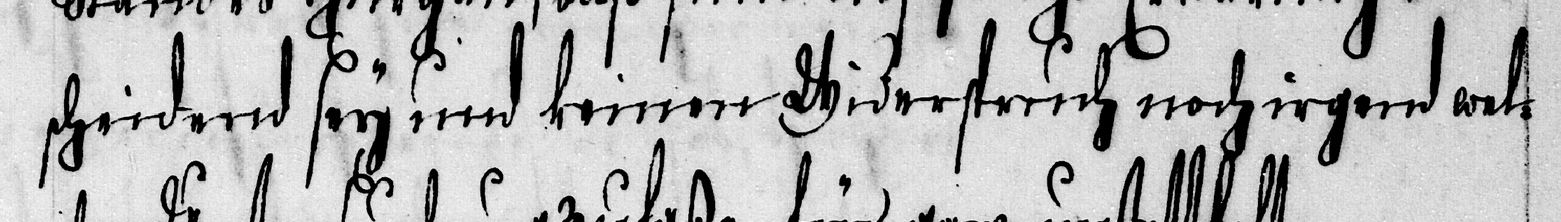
scheidend sey und keinen Widerspruch noch irgend wel¬
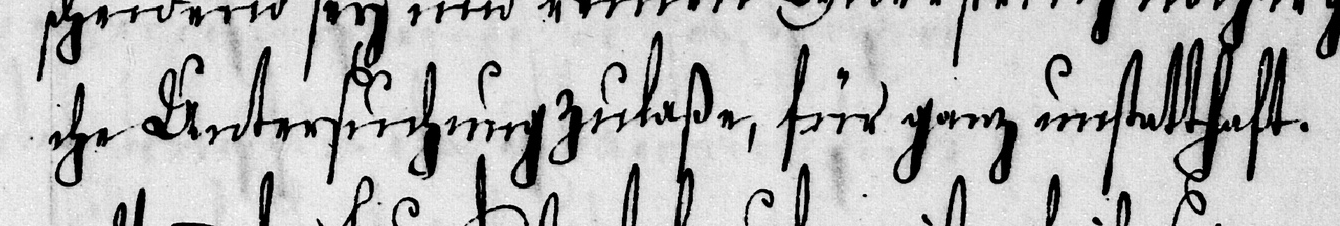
che Untersuchung zulaße, für ganz unstatthaft.
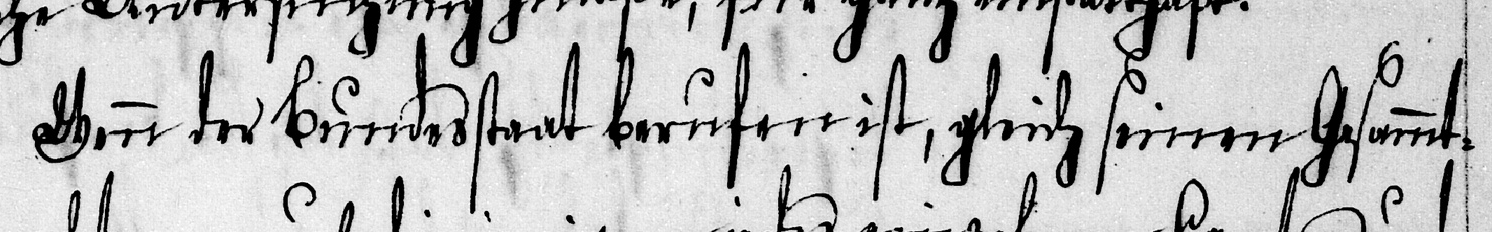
Wenn der Bundesstaat berufen ist, gleich seinen Gesamm¬
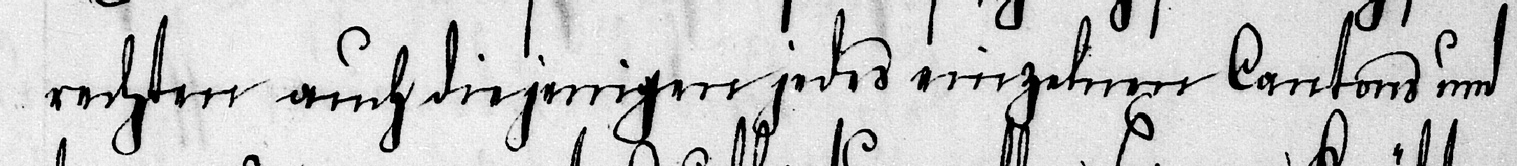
trechten auch diejenigen jedes einzelnen Cantons und
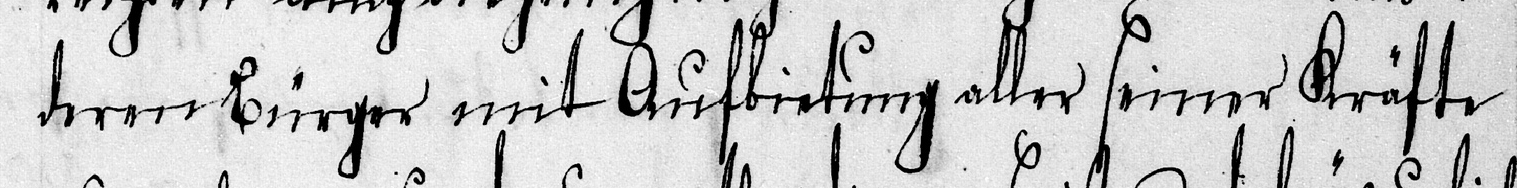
deren Bürger mit Aufbietung aller seiner Kräfte
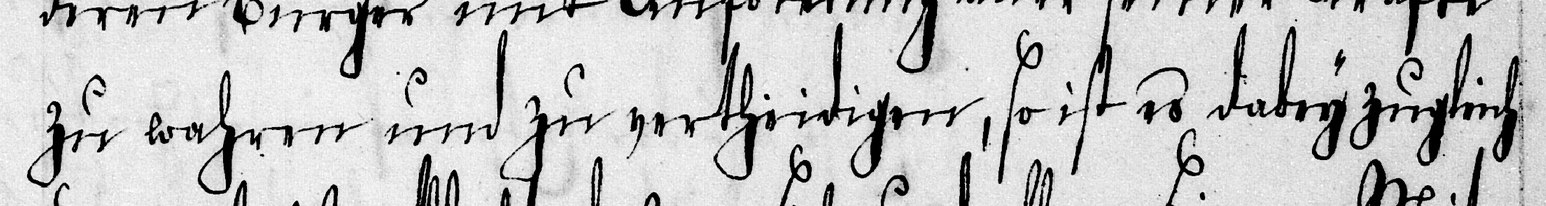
zu wahren und zu vertheidigen, so ist es dabey zugleich
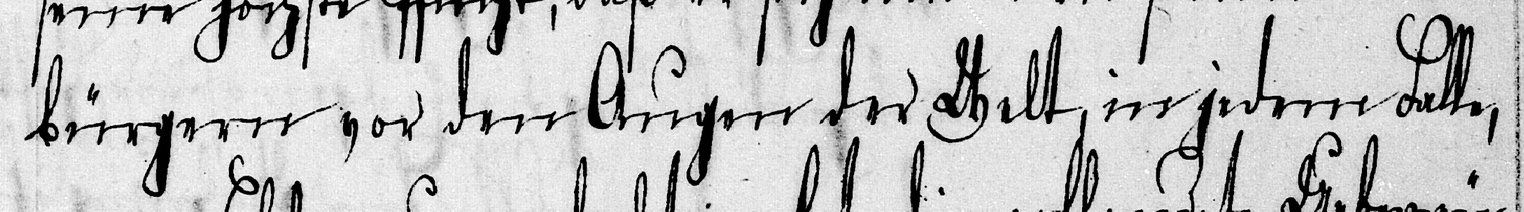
bürgern vor den Augen der Welt, in jedem Falle,
